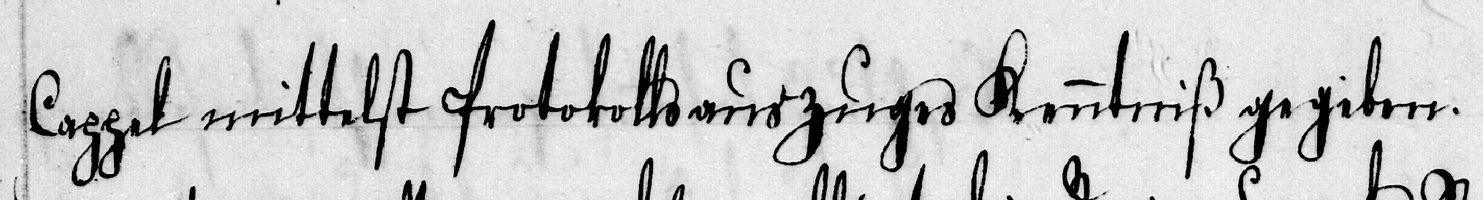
Cappel mittelst Protokollsauszuges Kenntniß gegeben.
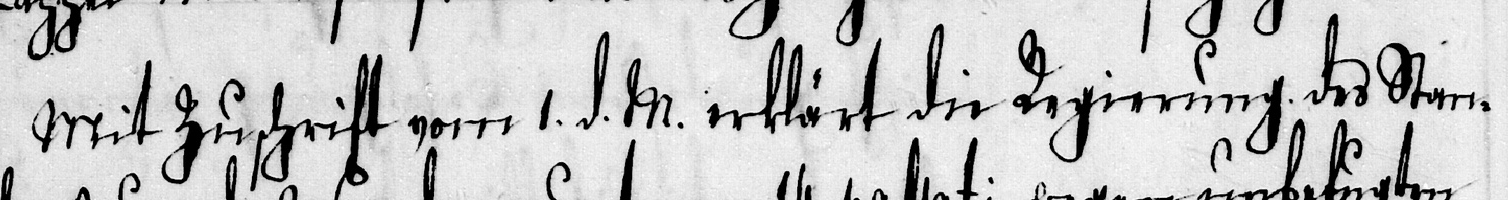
Mit Zuschrift vom 1. d. M. erklärt die Regierung des Stan¬
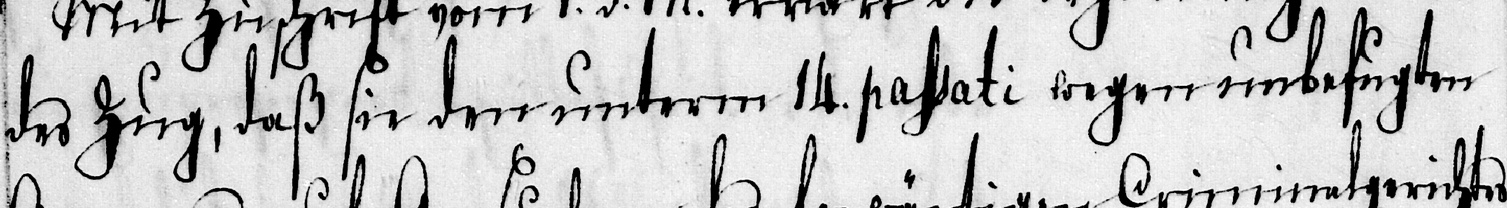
des Zug, daß sie den unterm 14. passati wegen unbefugten
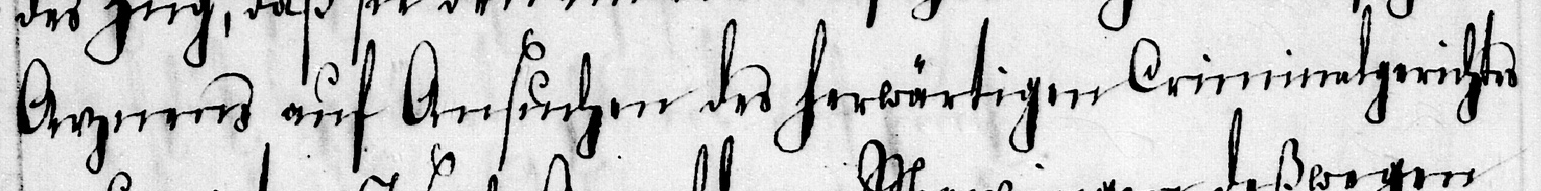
Arznens auf Ansuchen des herwärtigen Criminalgerichtes
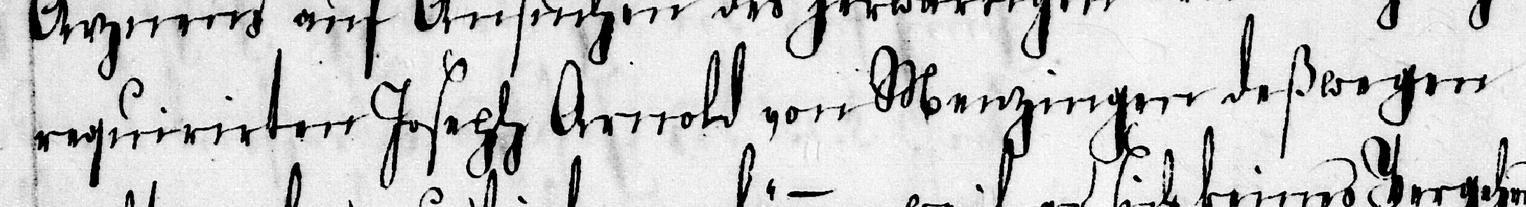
requirirten Joseph Arnold von Menzingen deßwegen
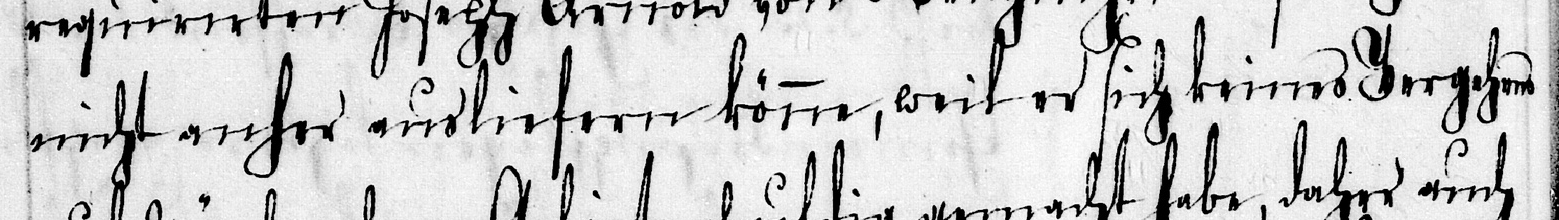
nicht anher ausliefern könne, weil er sich keines Vergehens
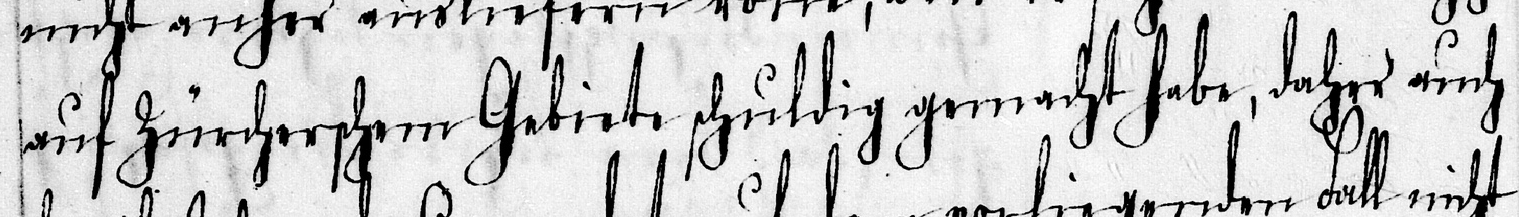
auf Zürcherschen Gebiete schuldig gemacht habe, daher auch
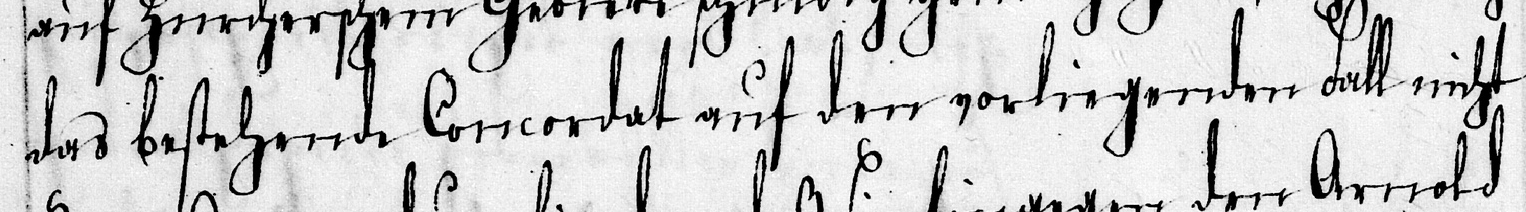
das bestehende Concordat auf den vorliegenden Fall nic¬
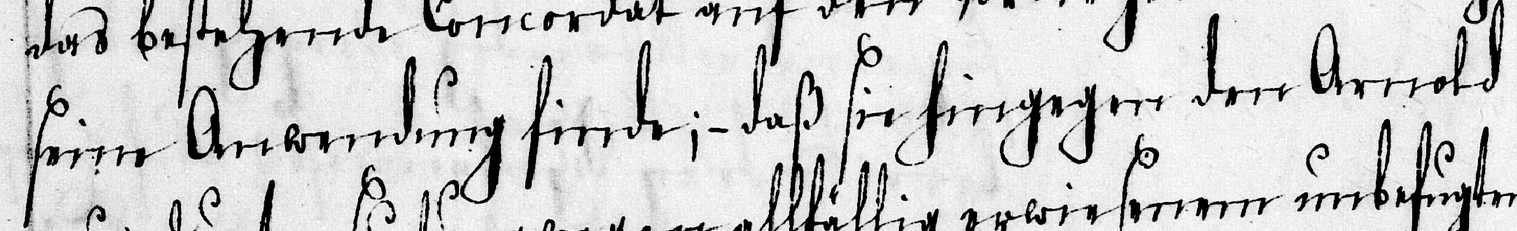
seine Anwendung finde; – daß sie hingegen den Arnold
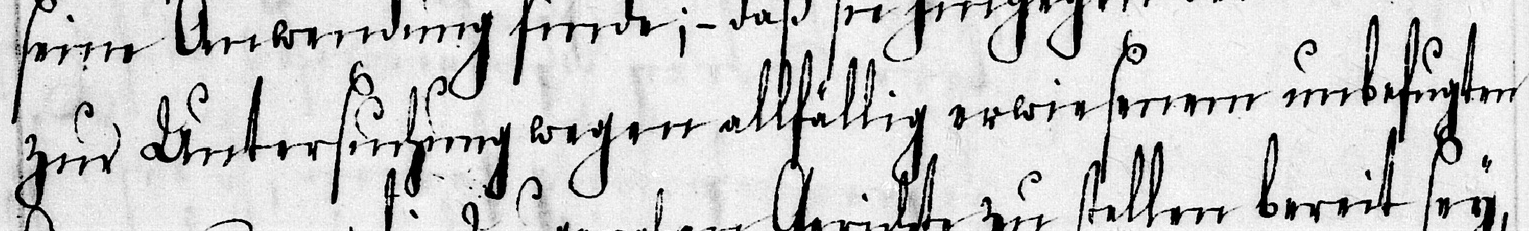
zur Untersuchung wegen allfällig erwiesenem unbefugten
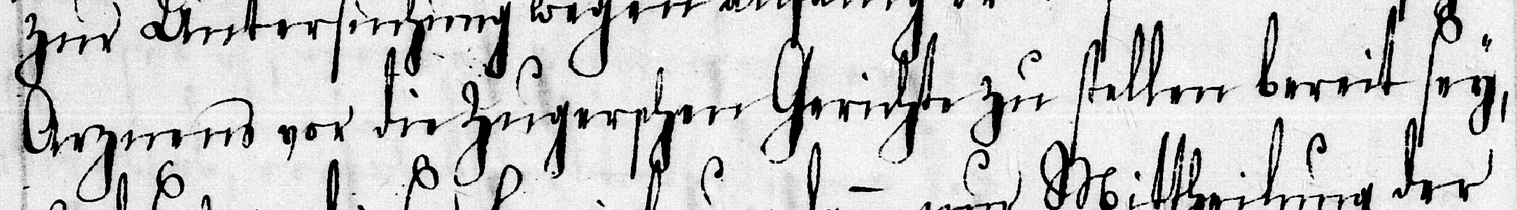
Arznens vor die Zugerschen Gerichte zu stellen bereit sey,
